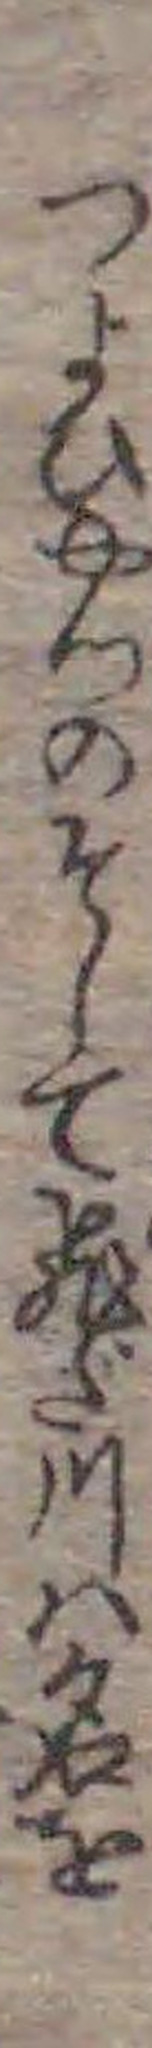つよひやつのそして飛だ川は名を
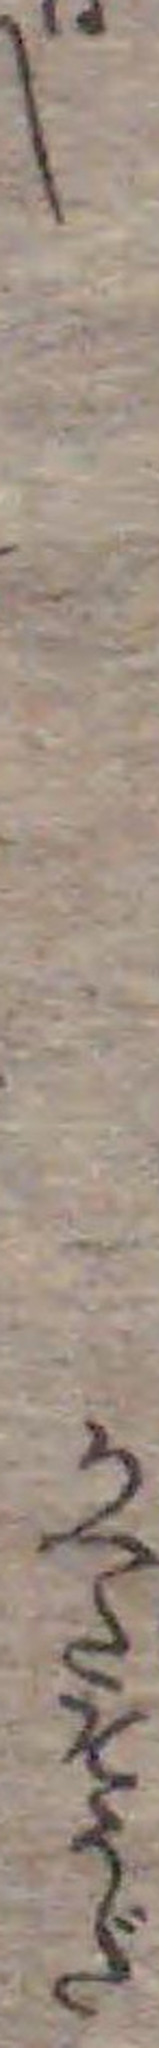かへたそうだ
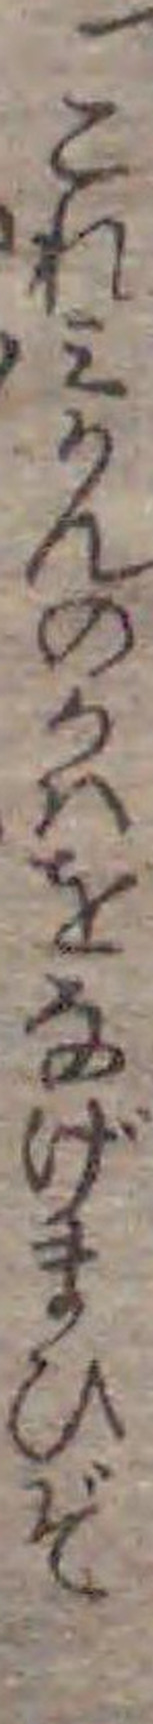〽これみかんのかはをなげまひぞ
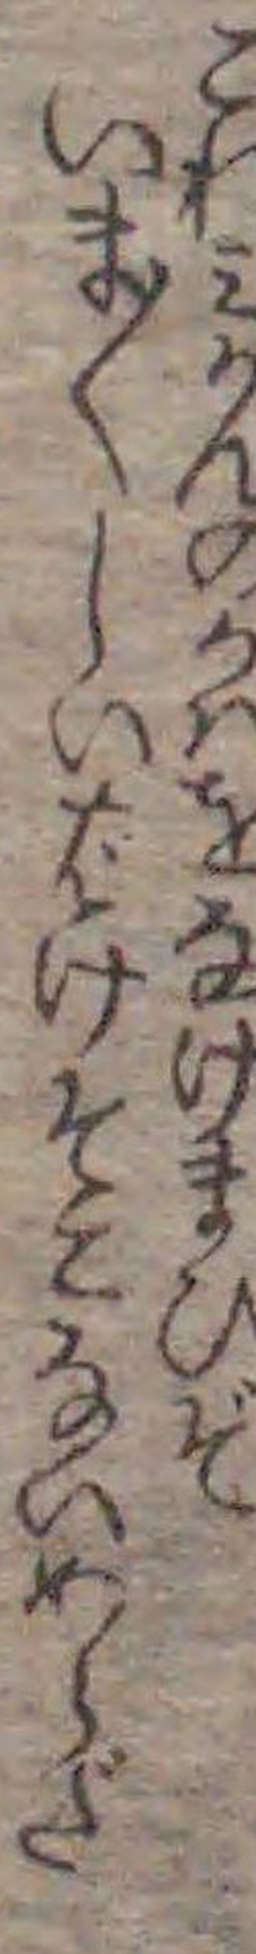いま〳〵しいばけそこないめらだ

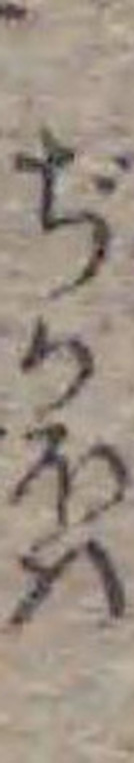ぢかほは
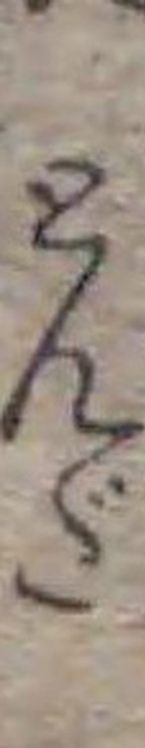とんだ
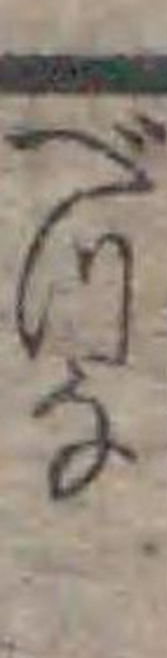べつな
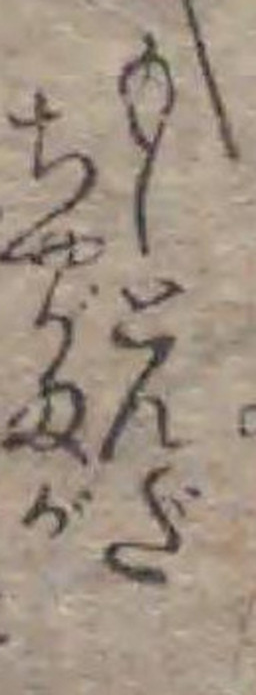ちやがまが
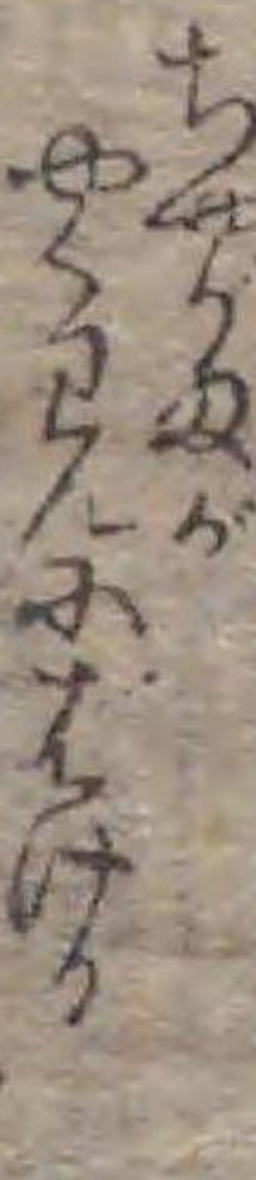やくわんにはける
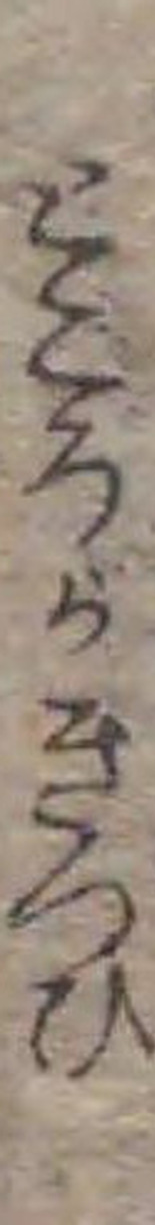ところがきつひ
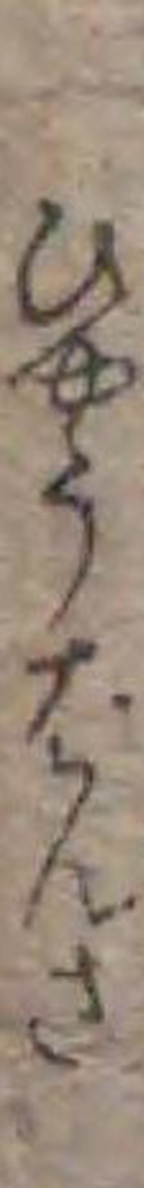ひやうばんさ
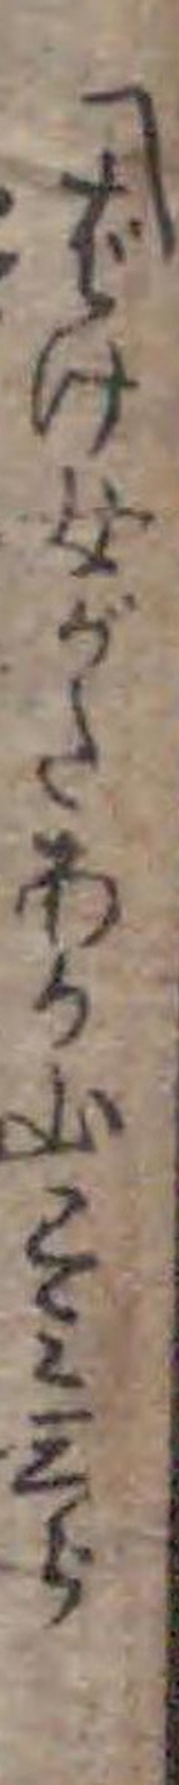〽ばけ女がたあか山とみ三郎
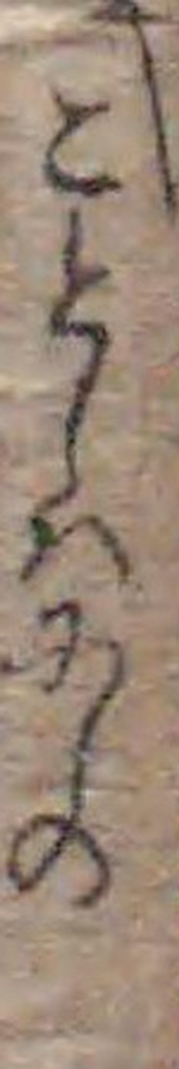〽ことしはにしの
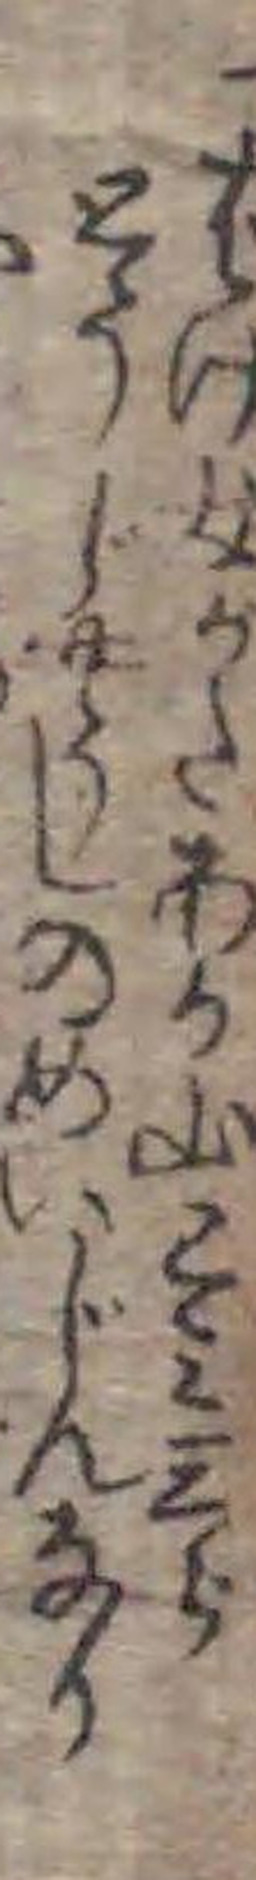とうじやうしのめいじんなり
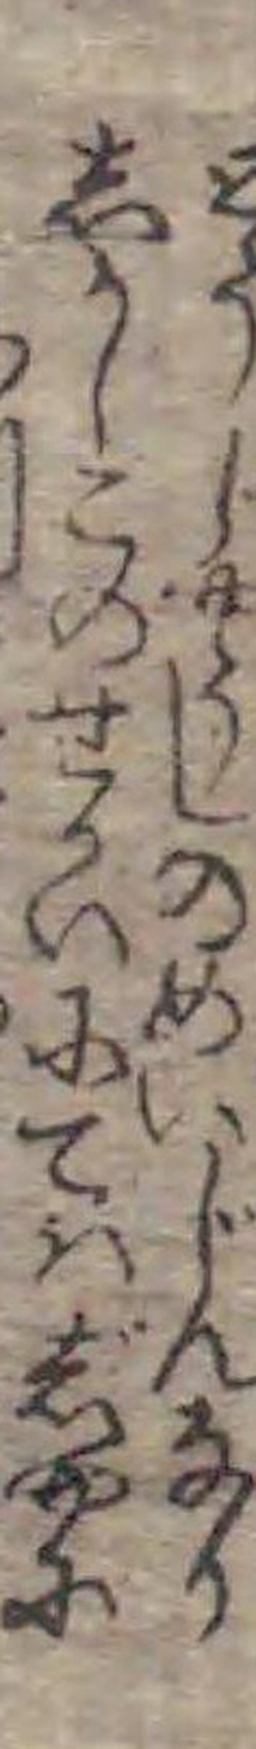しかしこのせかいにてはじやに
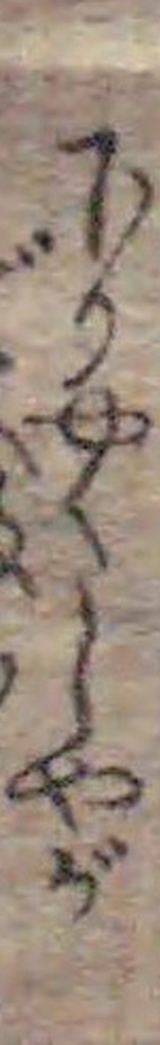下りやくしやが
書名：年中行状記 : 2巻
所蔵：国立国会図書館 National Diet Library, JAPAN
